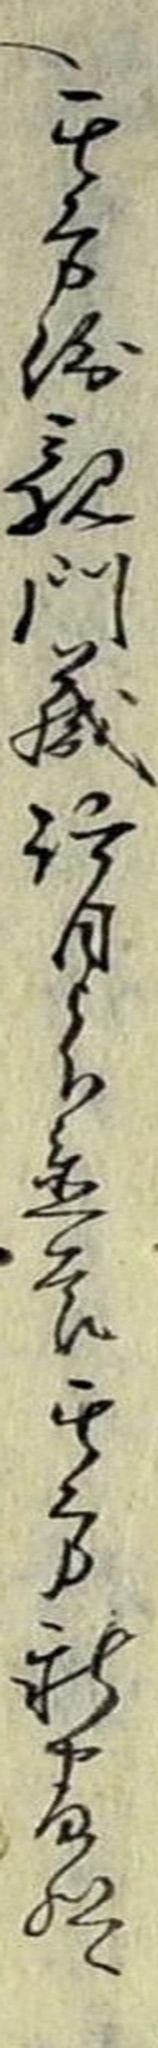其方儀親親門蔵跡目被下置節其方新番組へ
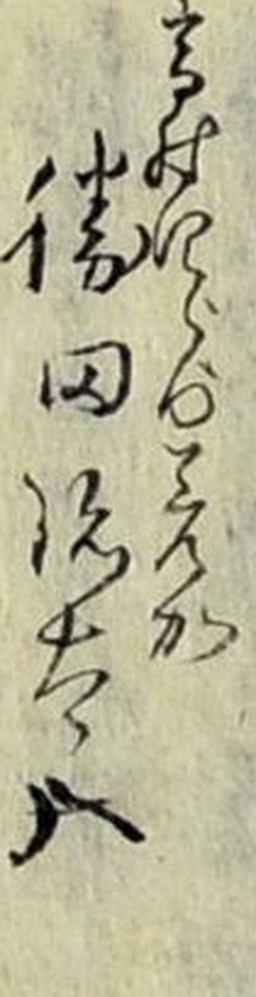勝田弥太八
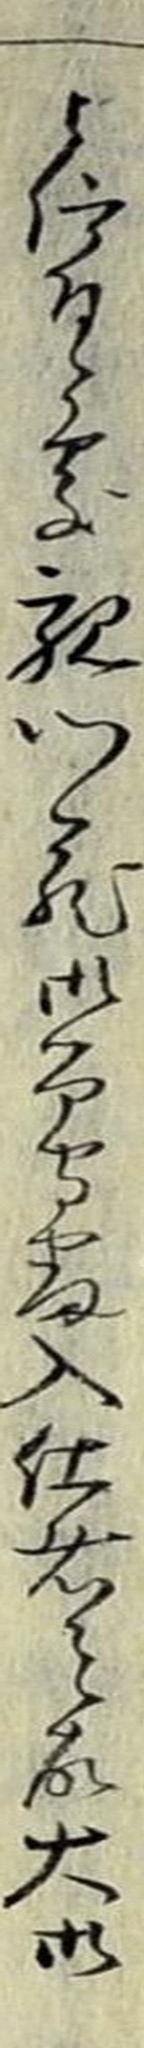被仰付候処親門蔵御留守番入仕者ニ候故大御
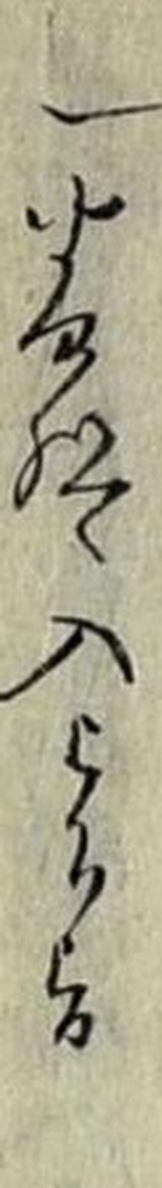番組へ入被下旨
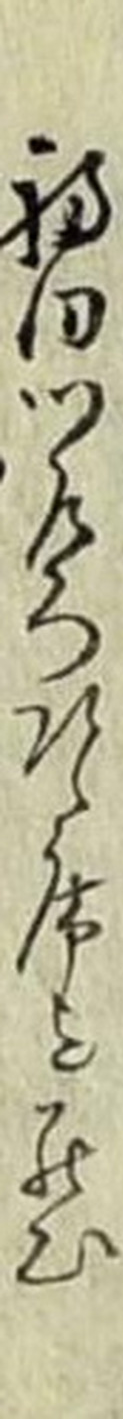福田門左衛門次之席迄罷出
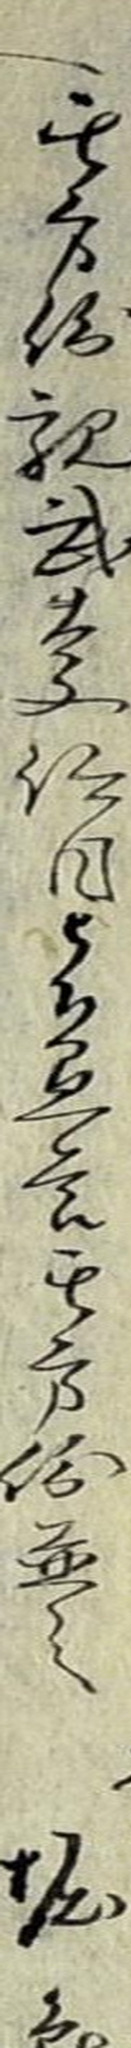其方儀親武大夫跡目被下置節其方儀並之
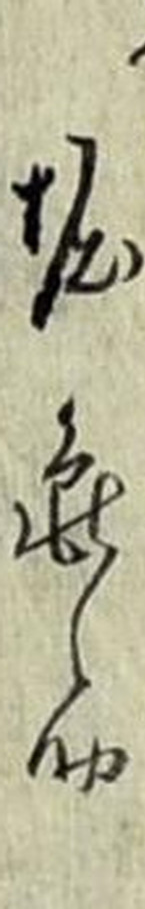堀亀之助
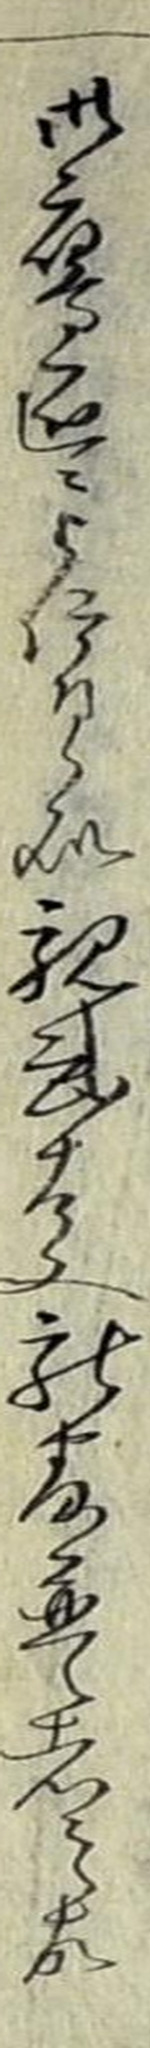御鷹匠ニ被仰付候処親武大夫新番並之者ニ候故
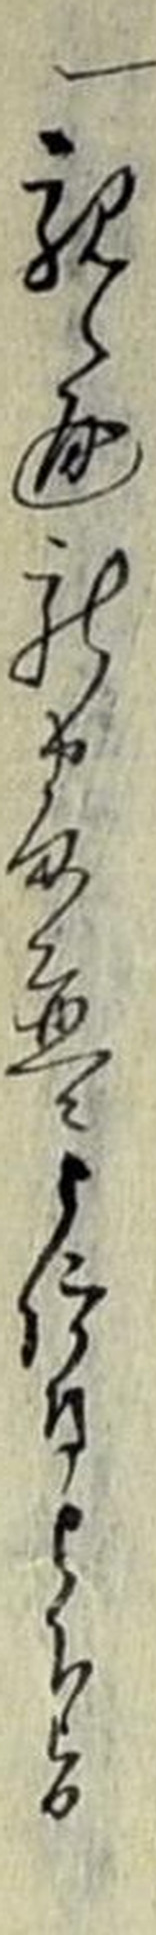親之通新番並ニ被仰付被下旨
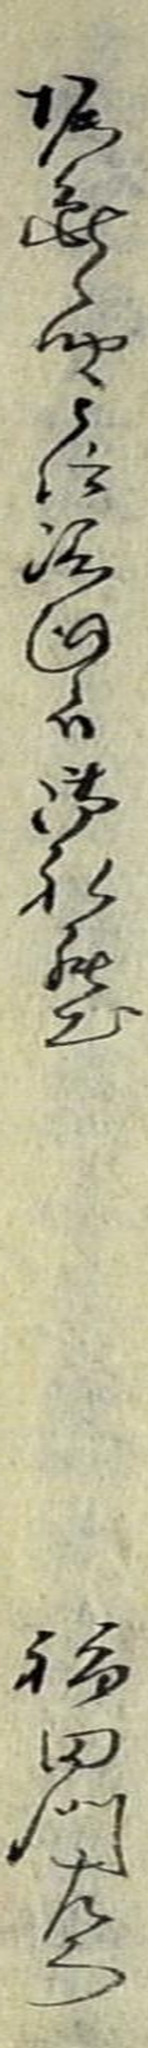堀亀之助へ被仰渡趣ニ付御礼罷出福田門左衛門
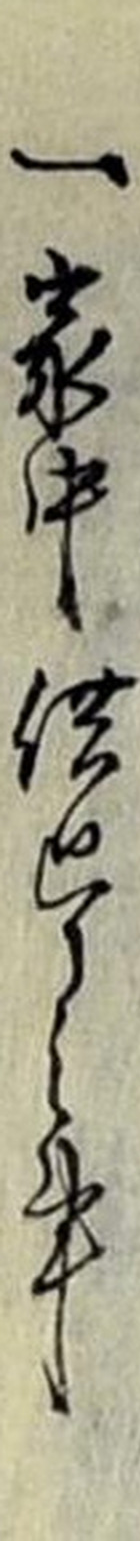一家中供廻り之事
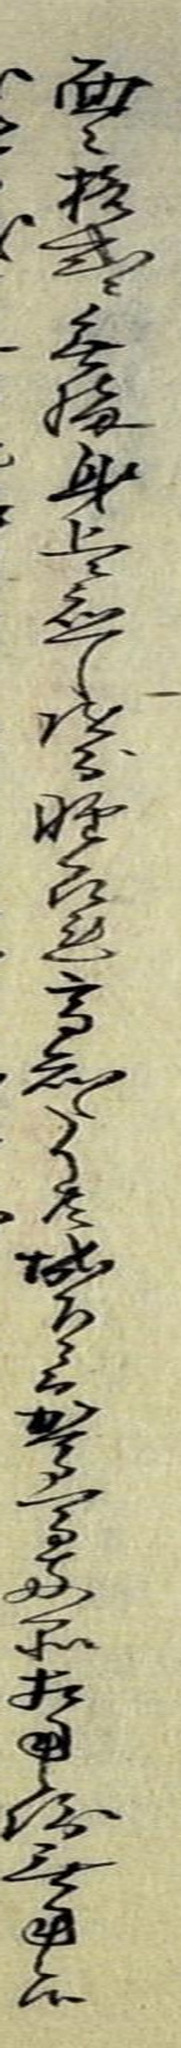面々格式ニ無構身上ニ応し随分軽召連高知たり共城下ニ而駕馬両品相用儀無用ニ候
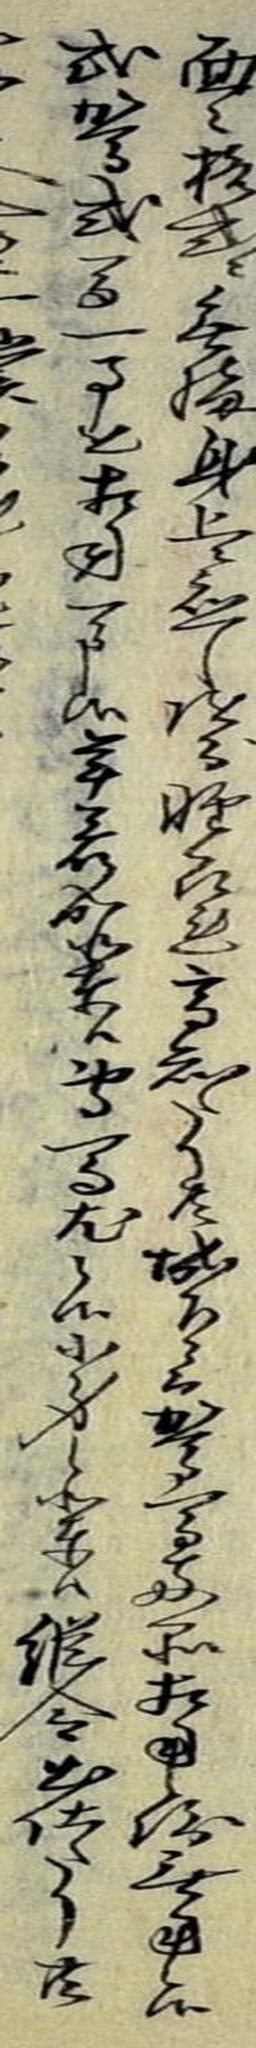或駕或馬一事を相用可申候年若成輩ハ専馬尤ニ候小身之輩ハ縦令出仕たり共
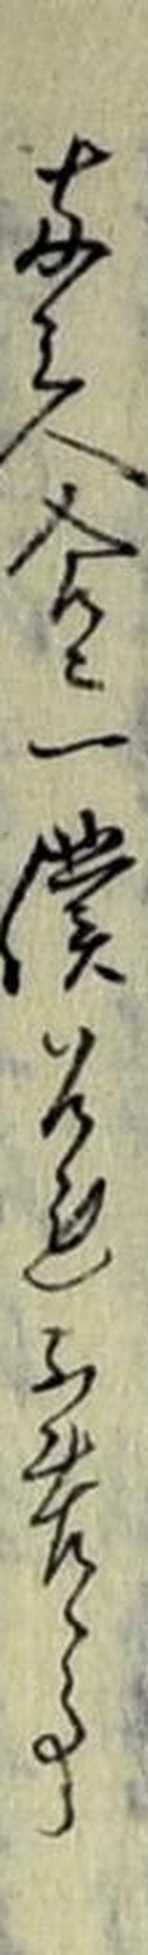両三人合ニ一僕召連不苦候事
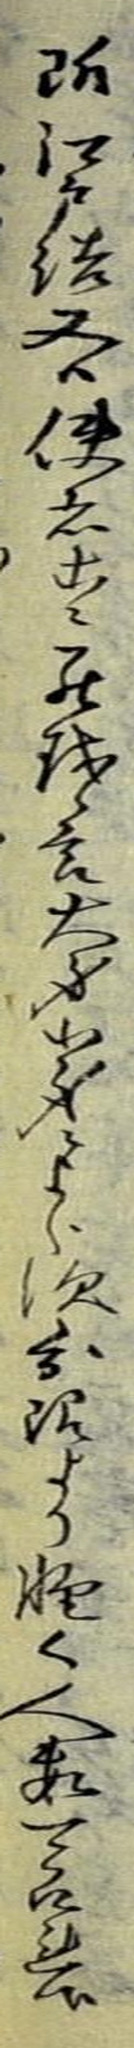附江戸詰又ハ使者等ニ罷越候節大身小身ニよらす分限より軽く人数可召連候
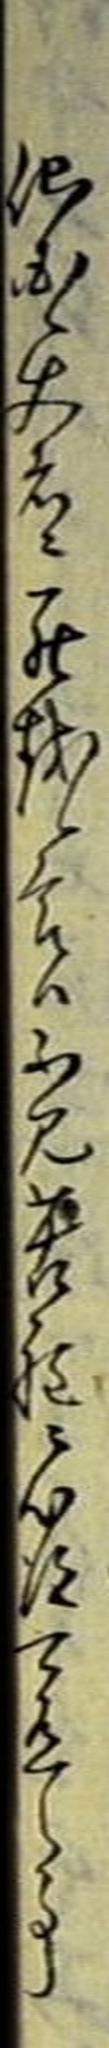他国へ使者ニ罷越候節ハ不見苦程ニ心得可有之事
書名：命令之部 一
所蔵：福井県文書館 Fukui Prefectural Archives
